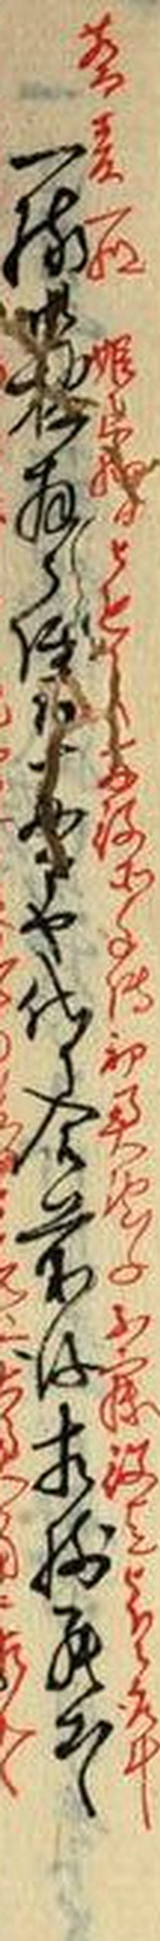一統御棺拝被仰付両部や代り合前後相揃罷出候
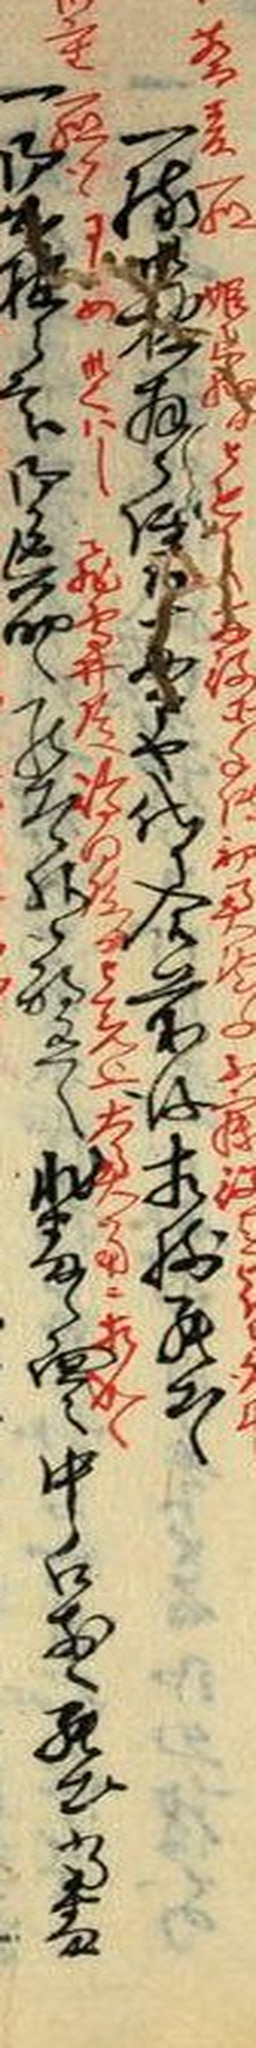一御出棺之節御道筋へ罷出候様御触有之非番之面々中ノ口前へ罷出当番
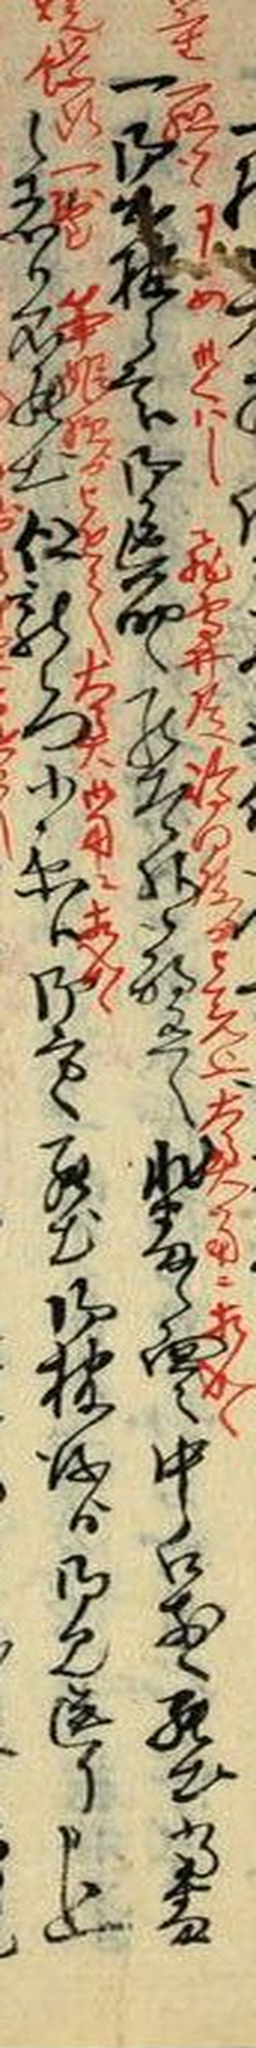之者ハ不罷出但新右衛門小兵衛ハ御方へ罷出御棺後ゟ御見送り申上
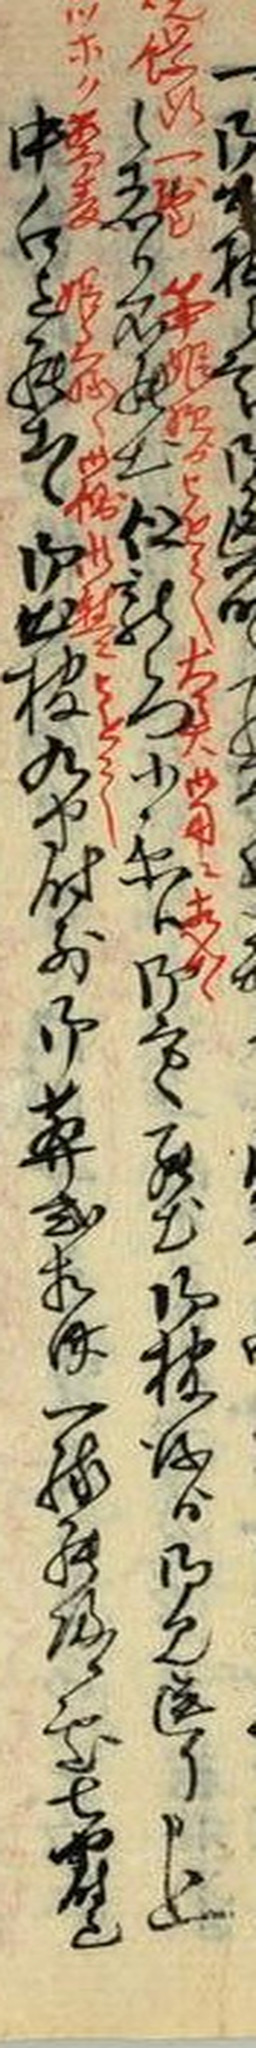中ノ口迄罷出候御出棺九半時前御葬式相済一統罷帰候処七半時過
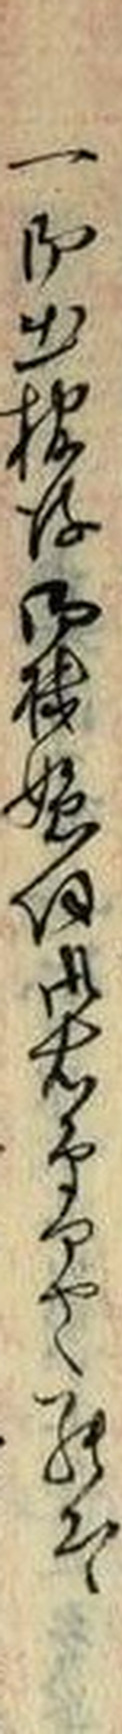一御出棺後御機嫌伺御右筆部やへ罷出候
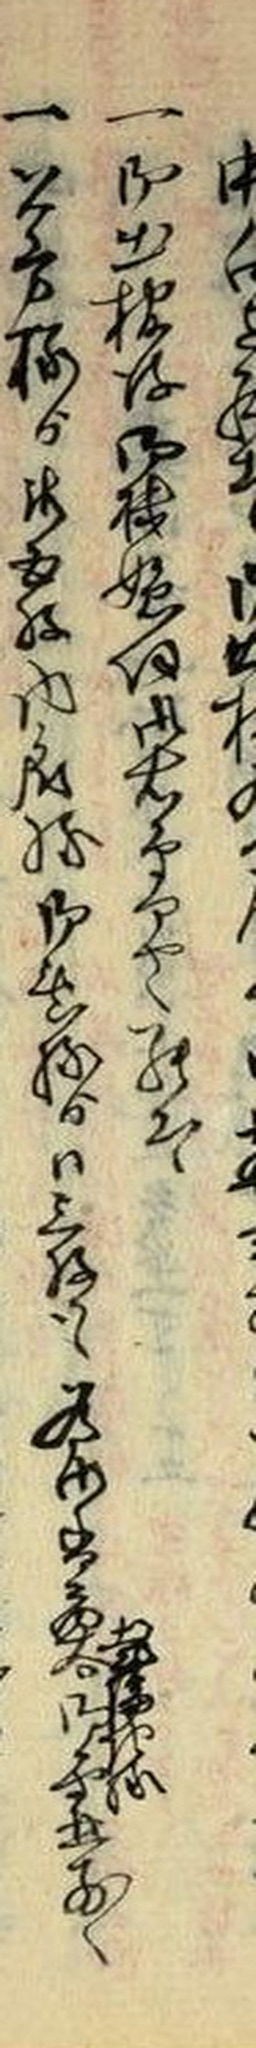一公方様ゟ銀五枚内府様御台様ゟ同三枚ツヽ為御香奠◦超倫院様御霊前へ
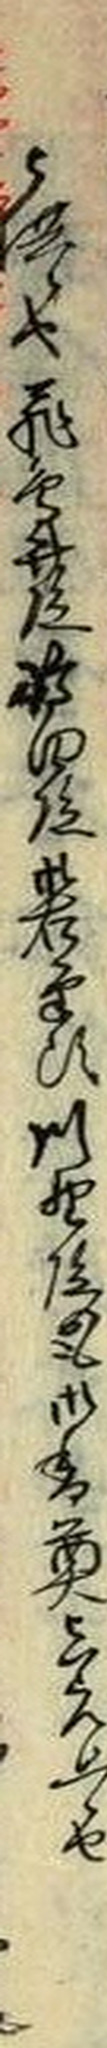被供候由飛鳥井殿嶋田殿御右筆頭川野殿ゟも御香奠被差上候由
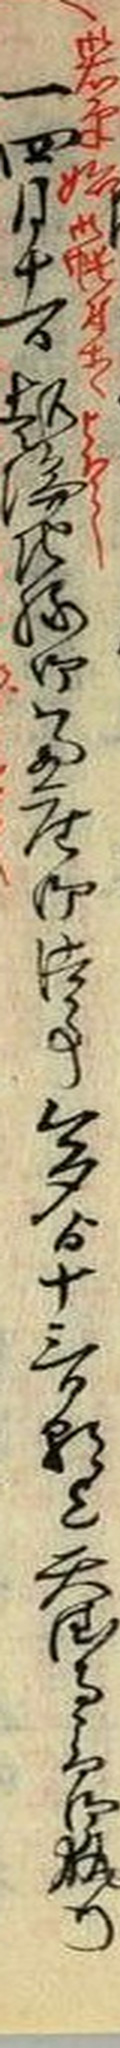一四月十一日超倫院様御当座御法事今夕ゟ十三日朝迄天徳寺ニ而御執行
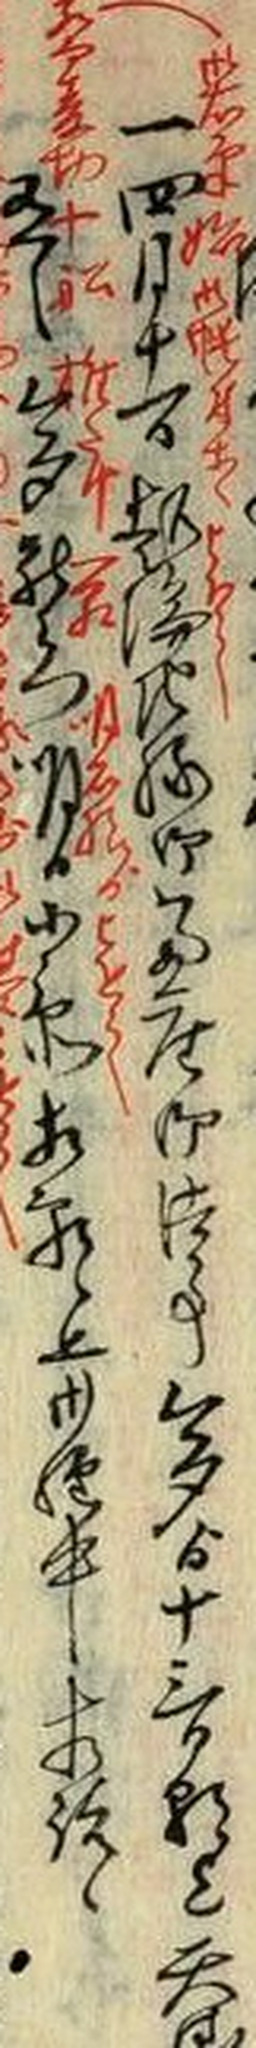有之今夕新右衛門明日小兵衛相願候上御経中相詰候
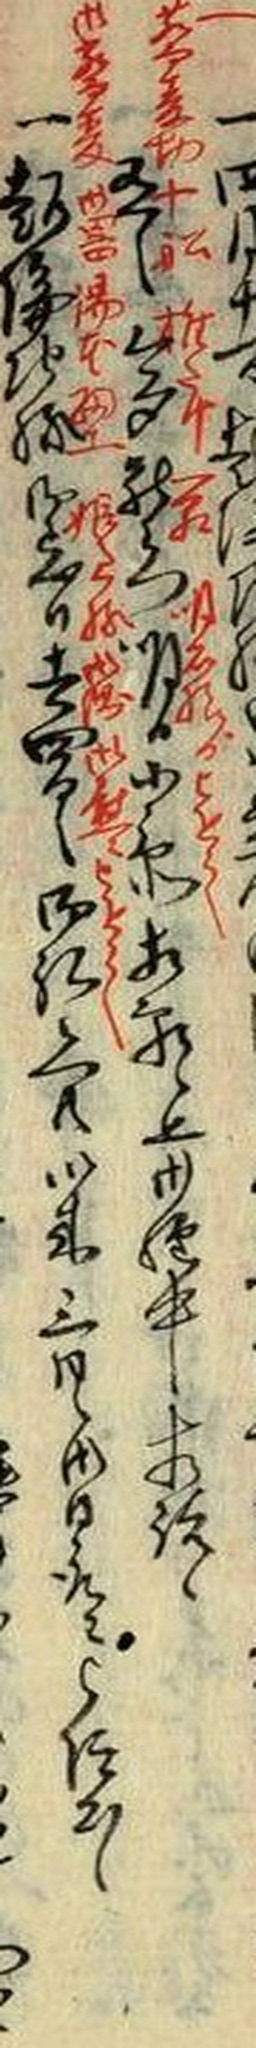一超倫院様御忌日去四日之御弘候へ共以来三日之御日取ニ被仰出候
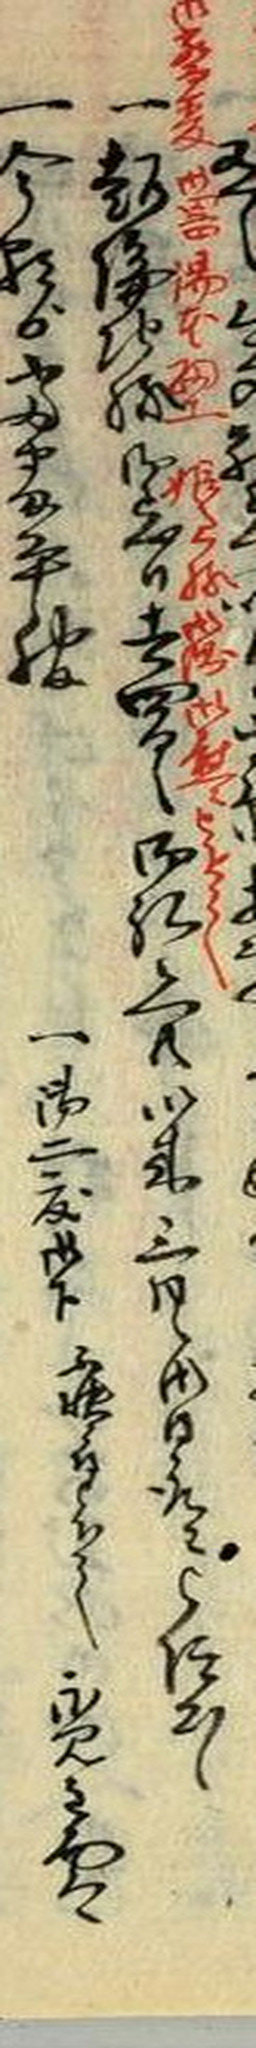一今朝ゟ当番平服一御二度御下不快ニ付被下之永見主殿へ
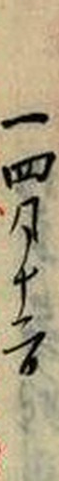一四月十二日
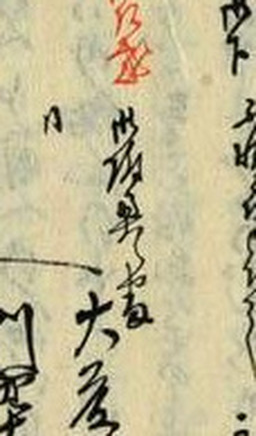御附奥之番
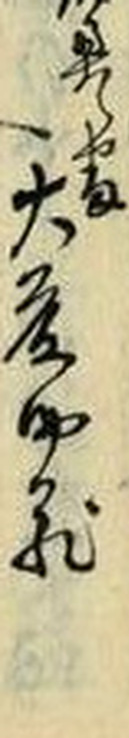大藤助蔵
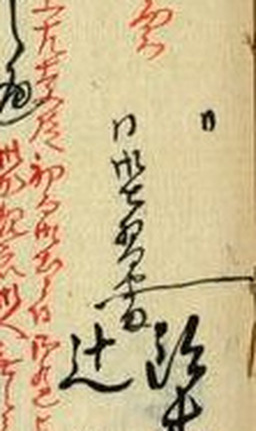同御近習番
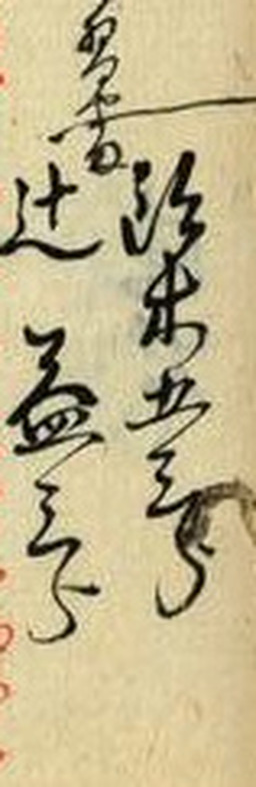辻益三郎
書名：少傅日録抄（斉承付側向頭取日記、在府）
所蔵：福井県文書館 Fukui Prefectural Archives
